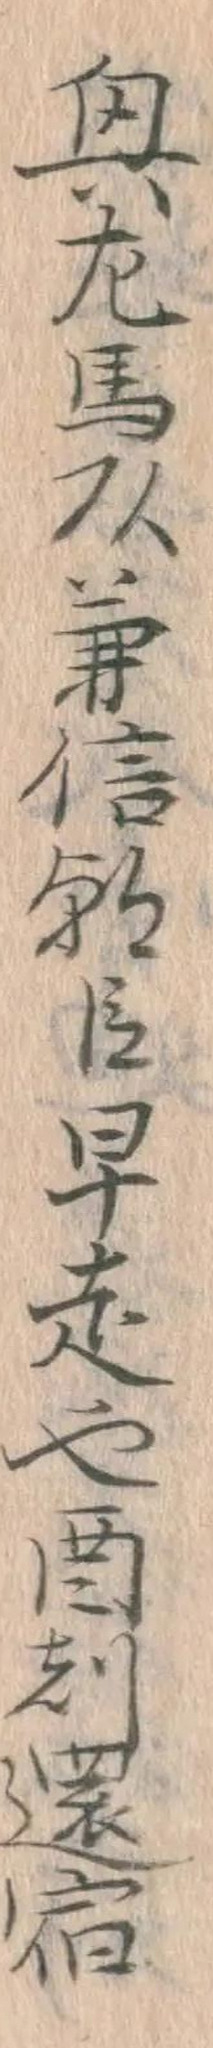興左馬頭兼信朝臣早走也酉刻還宿
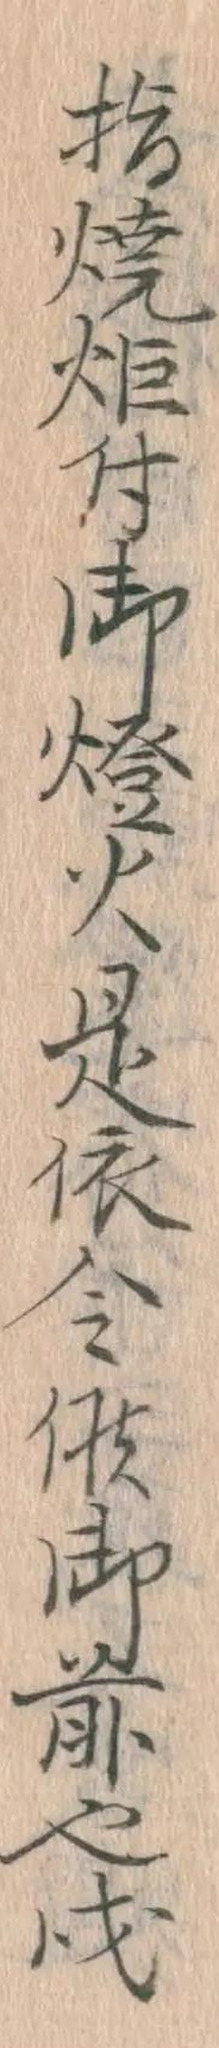指焼炬付御燈火是依令候御前也
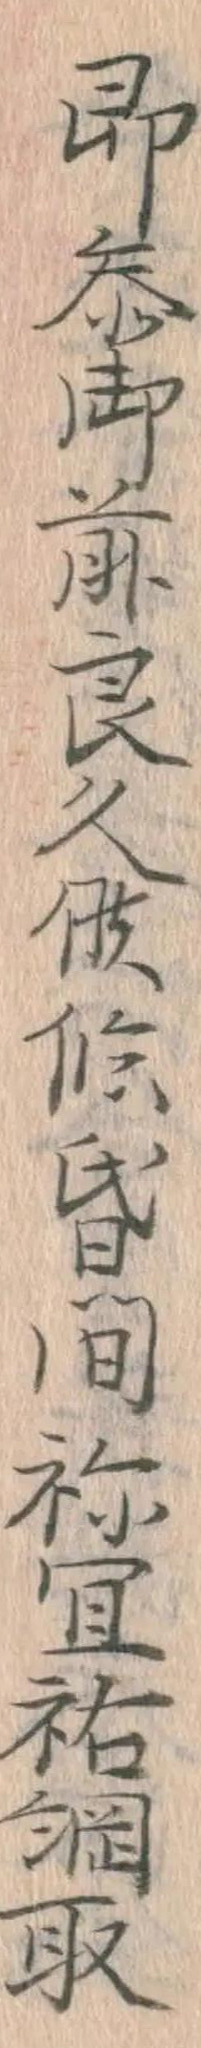即参御前良久候臨昏間祢宜祐綱取
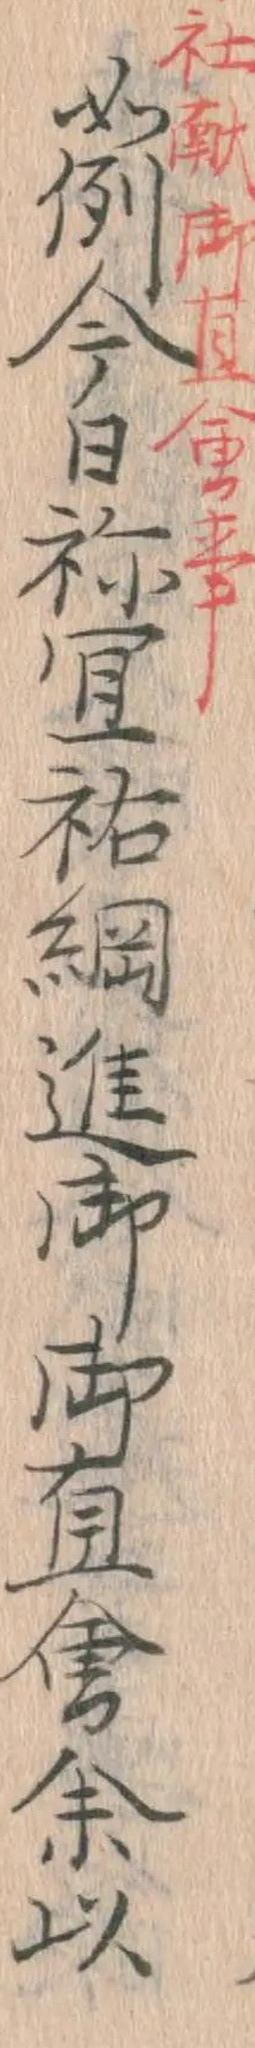如例今日祢宜祐綱進御御直会余以
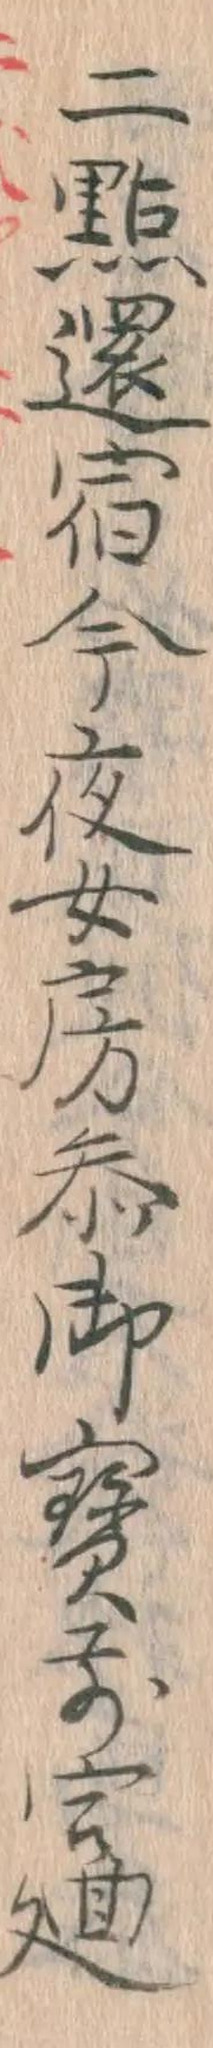二点還宿今夜女房参御宝前宮廻
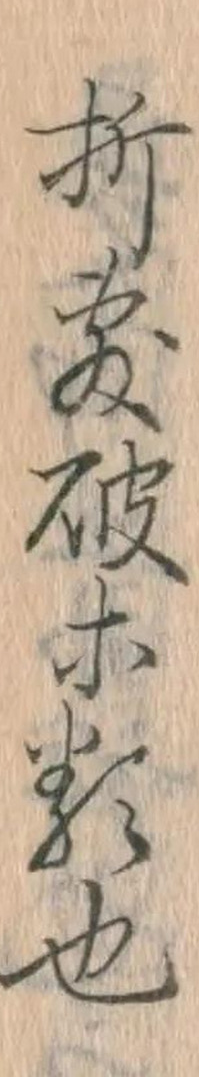折敷破等類也
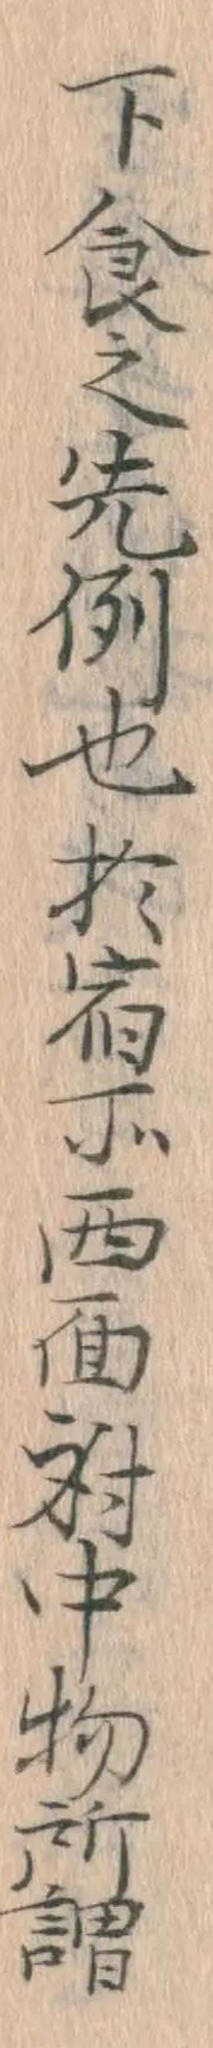下食之先例也於宿所西面射中物所謂
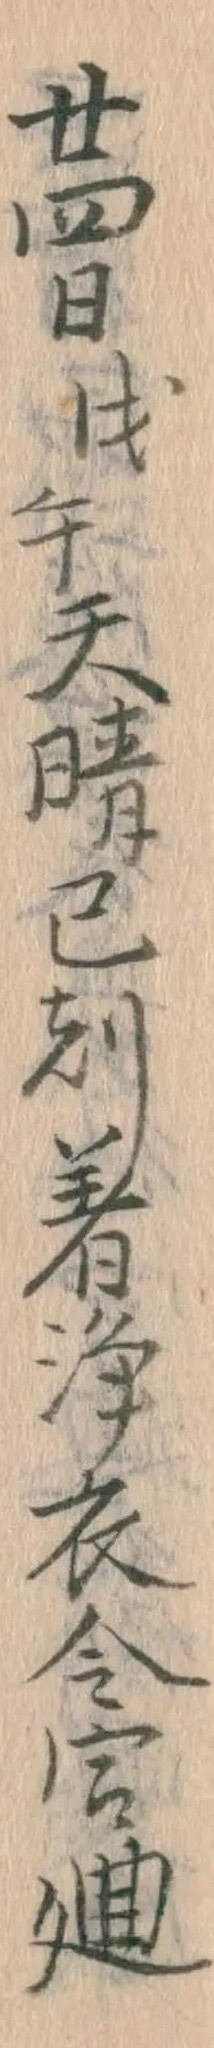廿四日戊午天晴巳刻着浄衣令宮廻
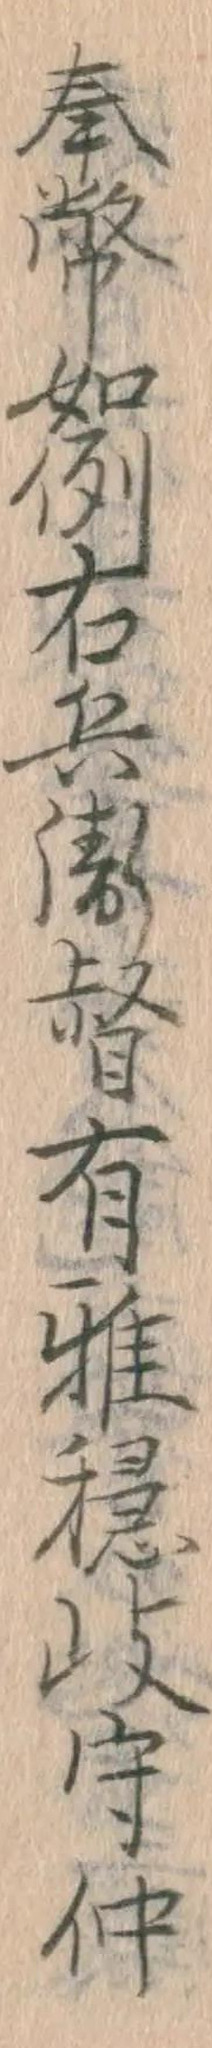奉幣如例右兵衛督有雅穏岐守仲
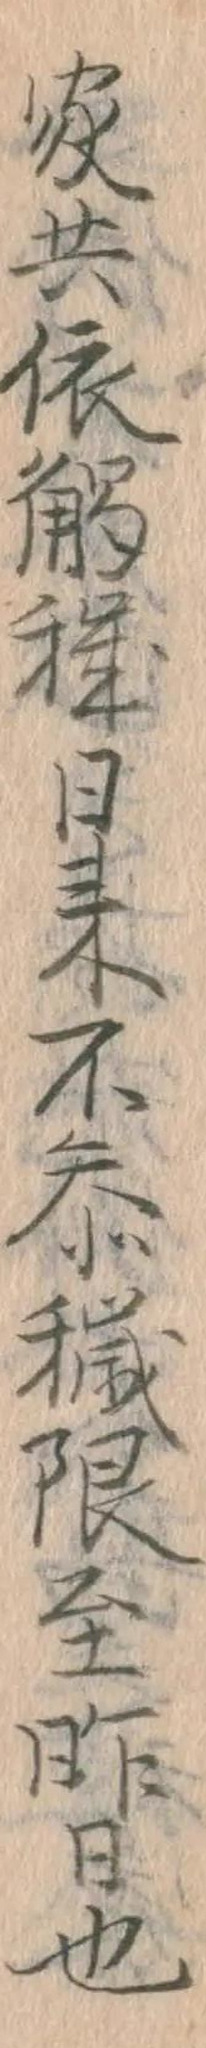家共依触穢日来不参穢限至昨日也
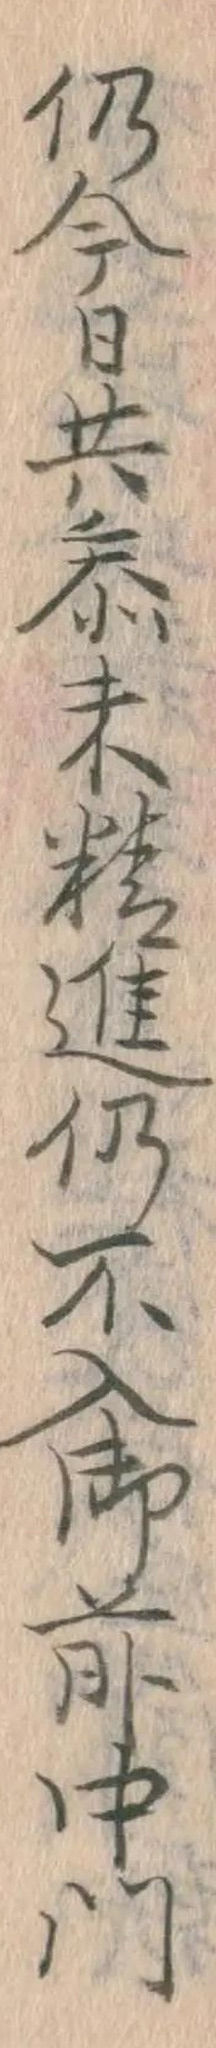仍今日共参未精進仍不入御前中門
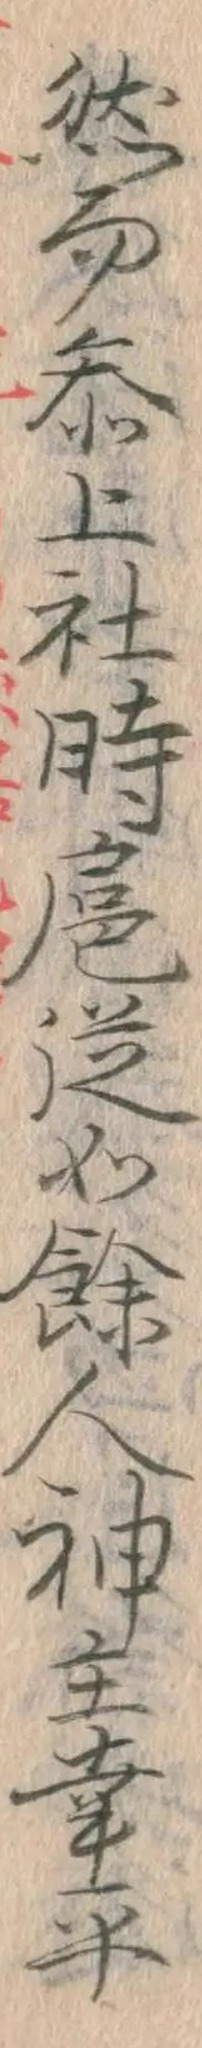然而参上社時扈従如余人神主幸平
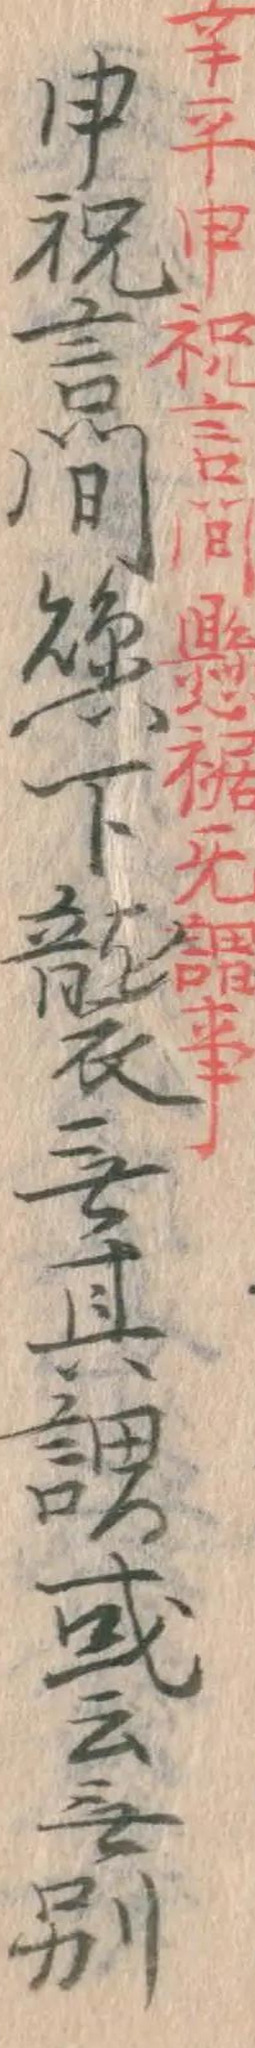申祝言間懸下襲無其謂或云無別
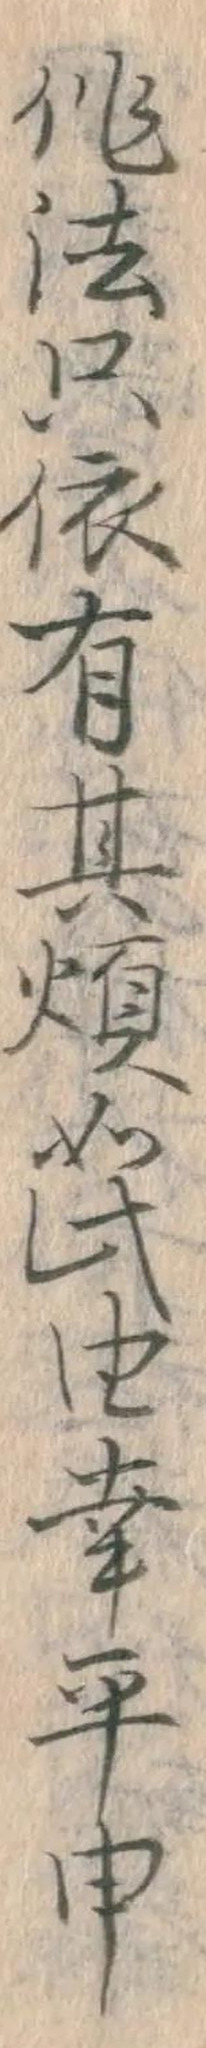作法只依有其煩如此由幸平申
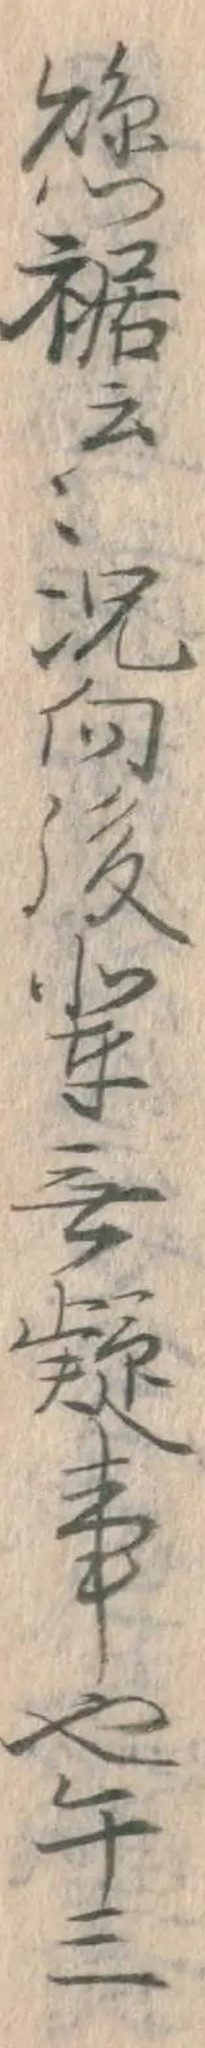懸裾云々況向後輩無疑事也午三
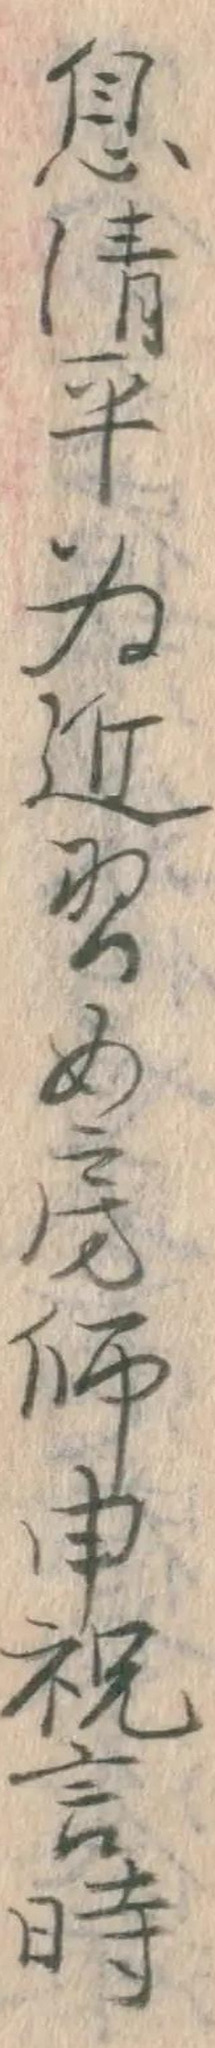息清平為近習女房師申祝言時
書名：賀茂社記録. 第80冊
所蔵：国立国会図書館 National Diet Library, JAPAN
